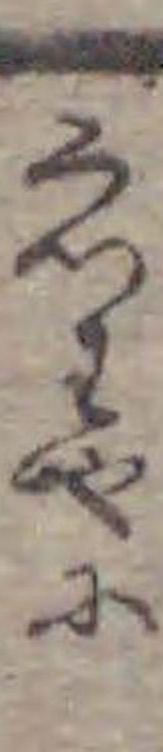くつわやに
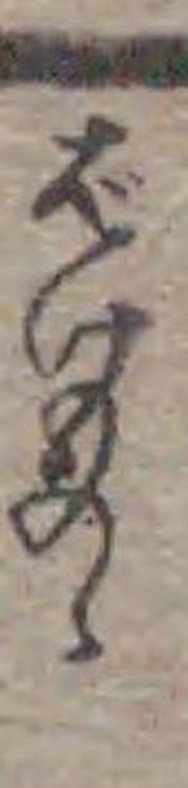ばけものゝ
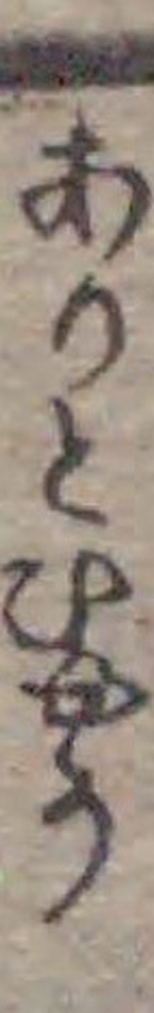ありとひやう
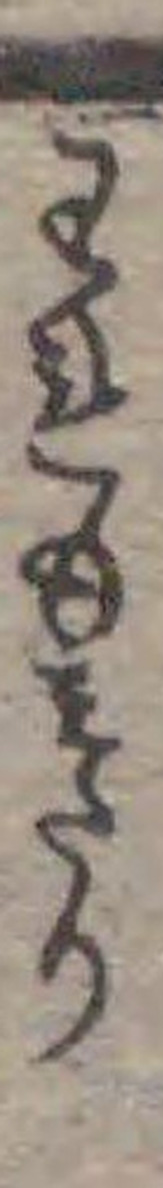われもみたり
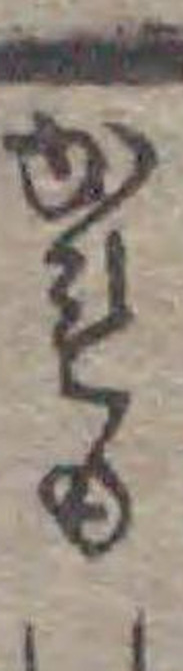かれも
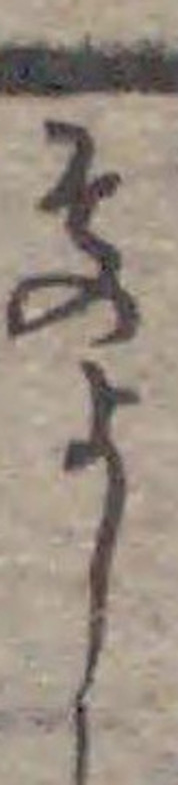そのよし
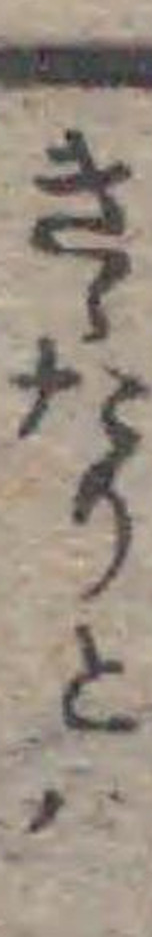きゝたりと
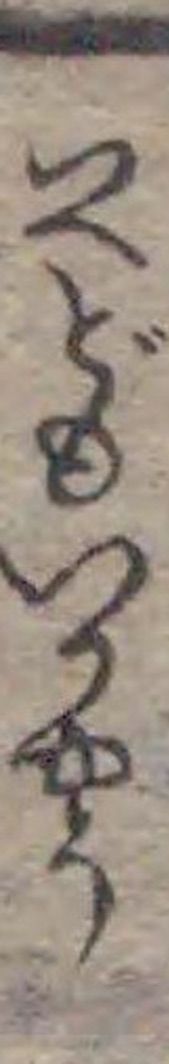いへどもいかやう
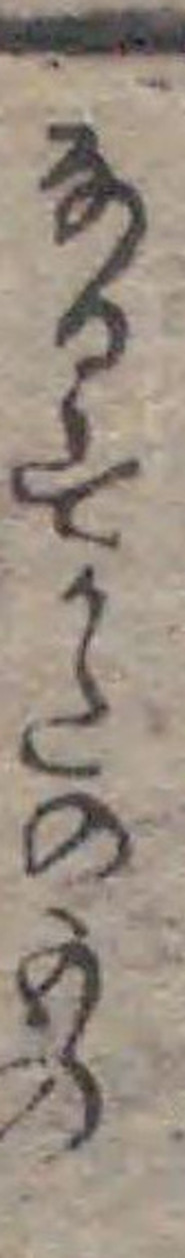なるすかたのもの
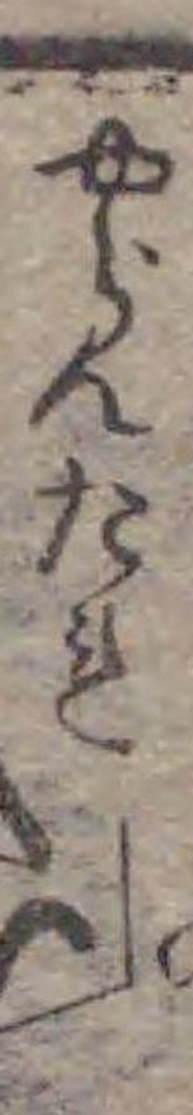やらんたれ
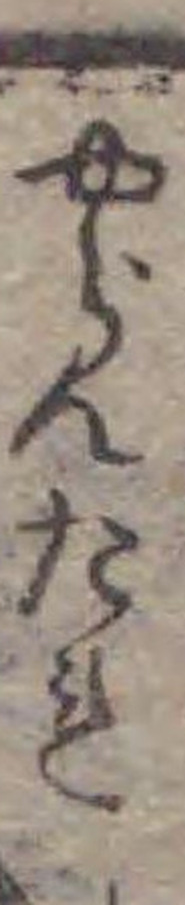やらんたれ
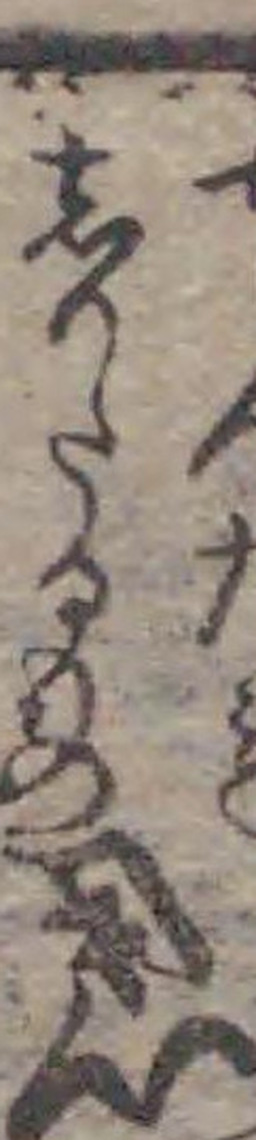しりたるもの
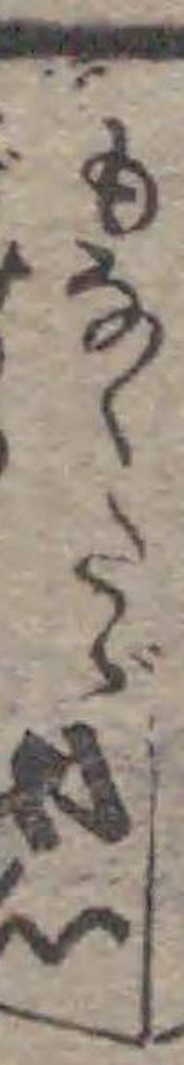もなくたゞ
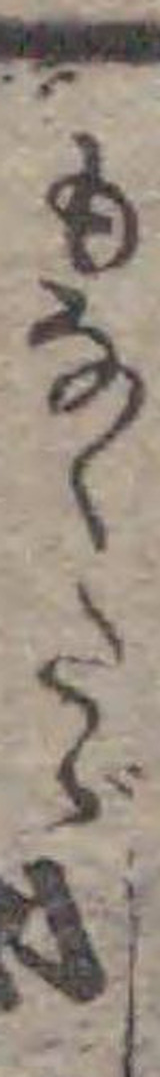もなくたゞ
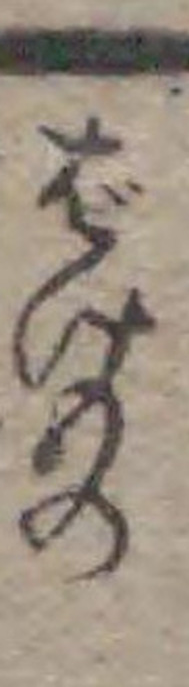ばけもの
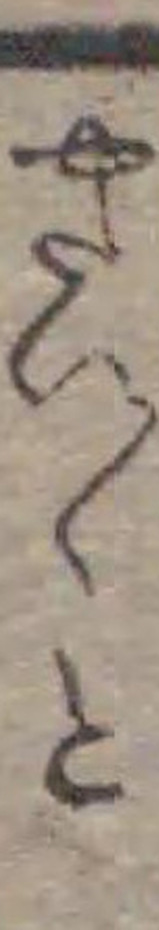やたい〳〵と
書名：変化物春遊 : 2巻
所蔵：国立国会図書館 National Diet Library, JAPAN
